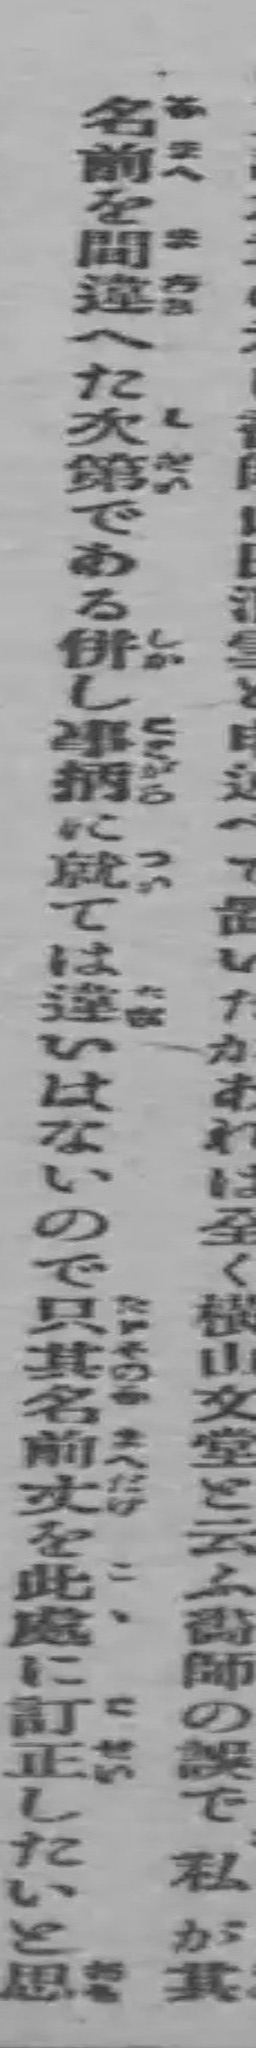名前を間違へた次第である併し事柄に就ては違いはないので只其名前丈を此処に訂正したいと思
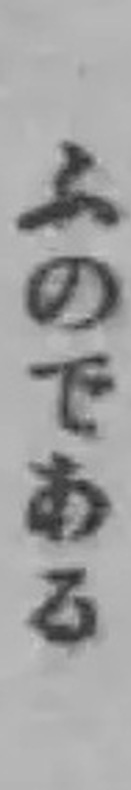ふのである
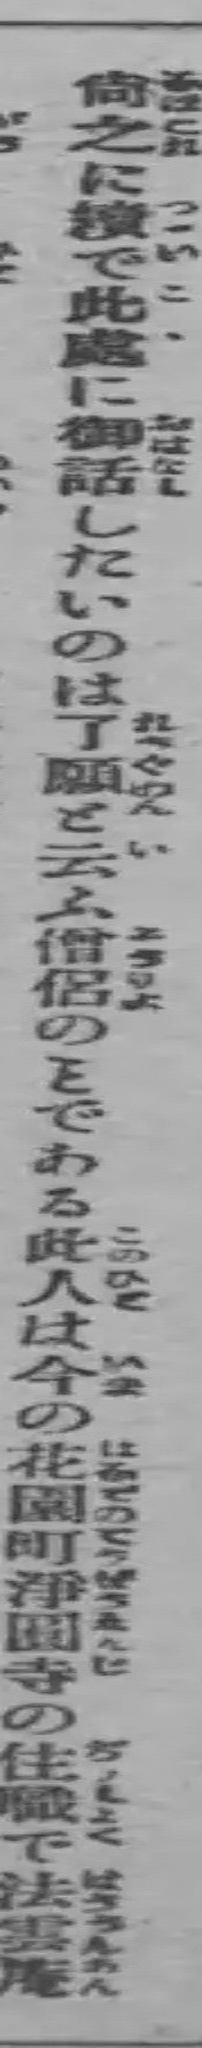僧了願尚之に続で此処に御話したいのは了願と云ふ僧侶のことである此人は今の花園町浄円寺の住職で法雲庵
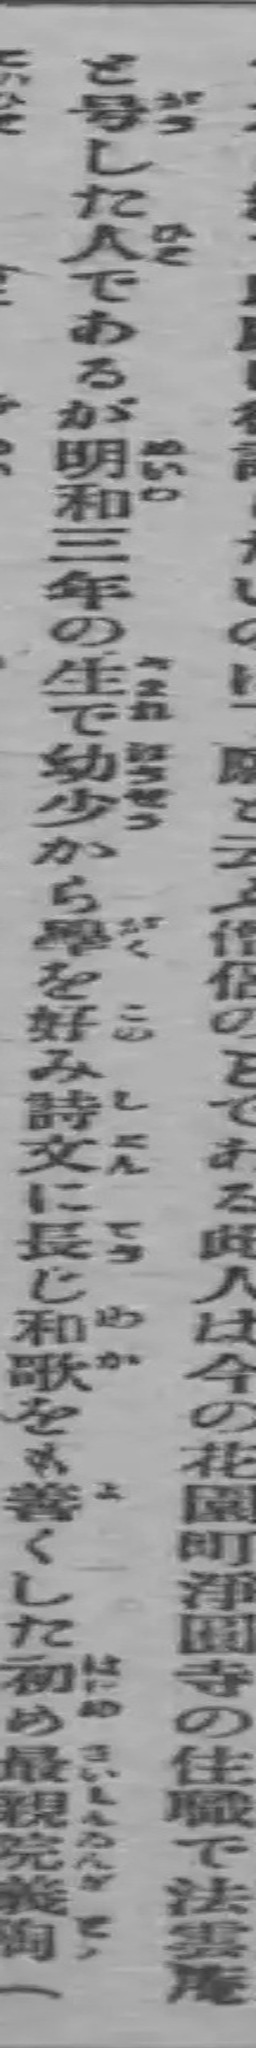と号した人であるが明和三年の生で幼少から学を好み詩文に長じ和歌をも善くした初め最親院義陶(
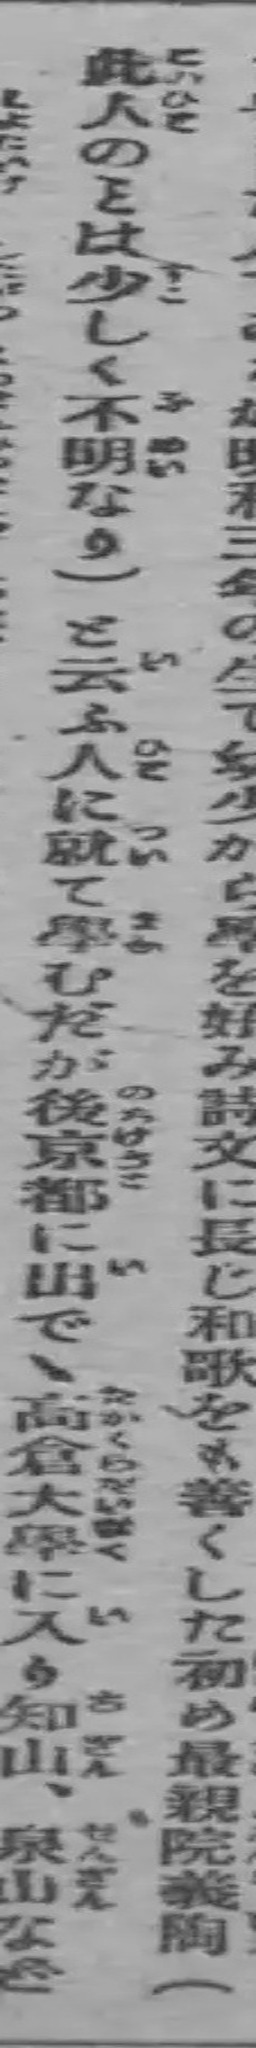此人のことは少しく不明なり)と云ふ人に就て学むだが後京都に出でゝ高倉大学に入り知山、泉山など
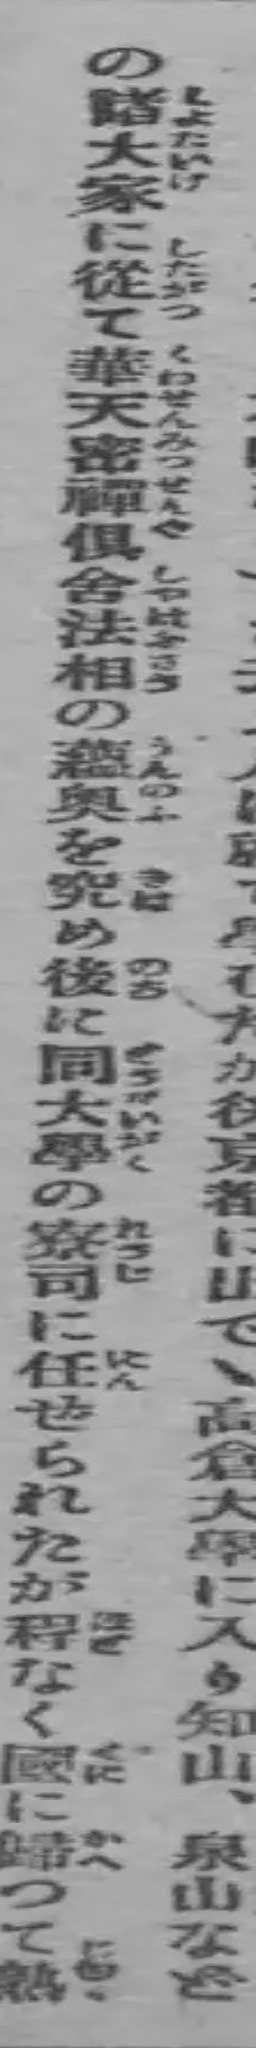の諸大家に従て華天蜜禅倶舎法相の蘊奥を究め後に同大学の寮司に任ぜられたが程なく国に帰つて熟
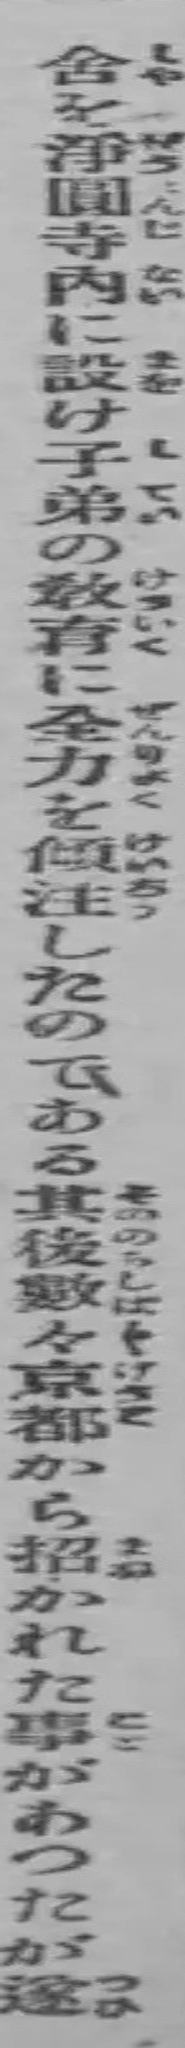舎を浄円寺内に設け子弟の教育に全力を傾注したのである其後数々京都から招かれた事があつたが遂
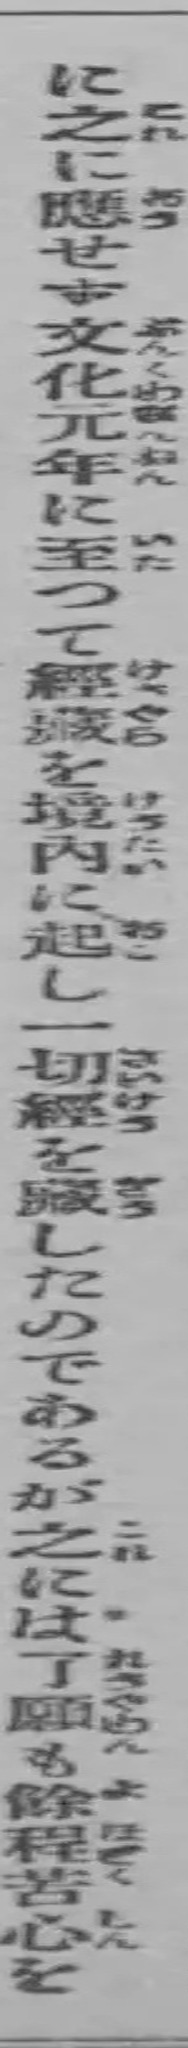に之に応せず文化元年に至つて経蔵を境内に起し一切経を蔵したのであるが之には了願も余程苦心を
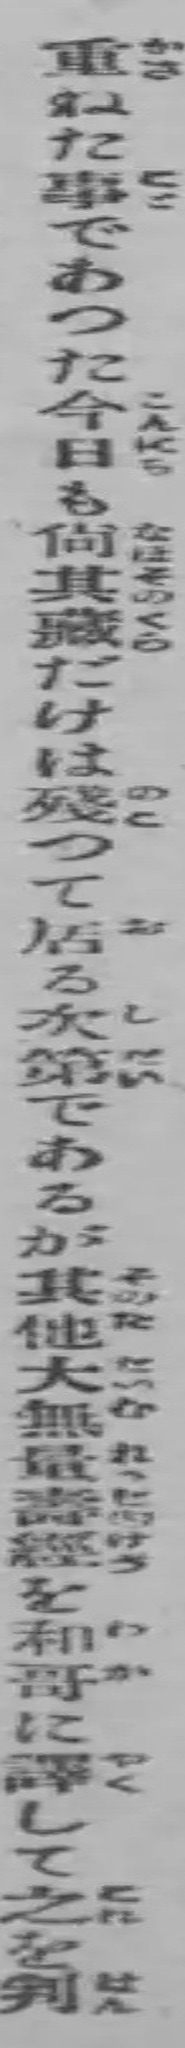重ねた事であつた今日も尚其蔵だけは残つて居る次第であるが其他大無量寿経を和哥に訳して之を判
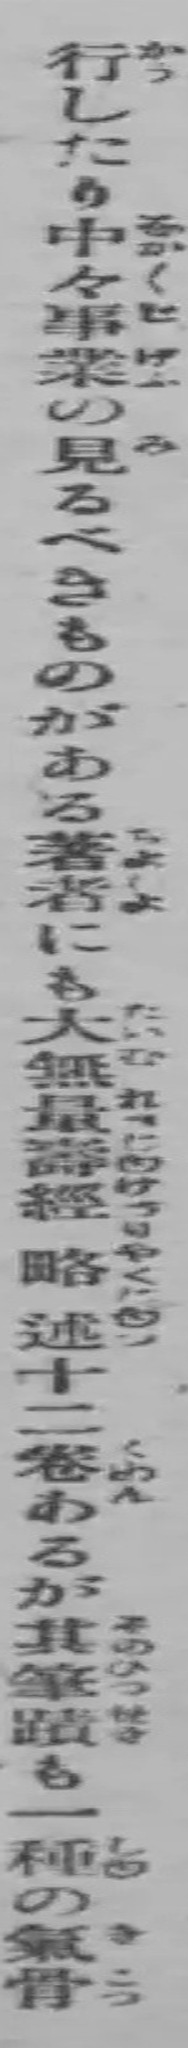行したり中々事業の見るべきものがある著者にも大無量寿経略述十二巻あるが其筆蹟も一種の気骨
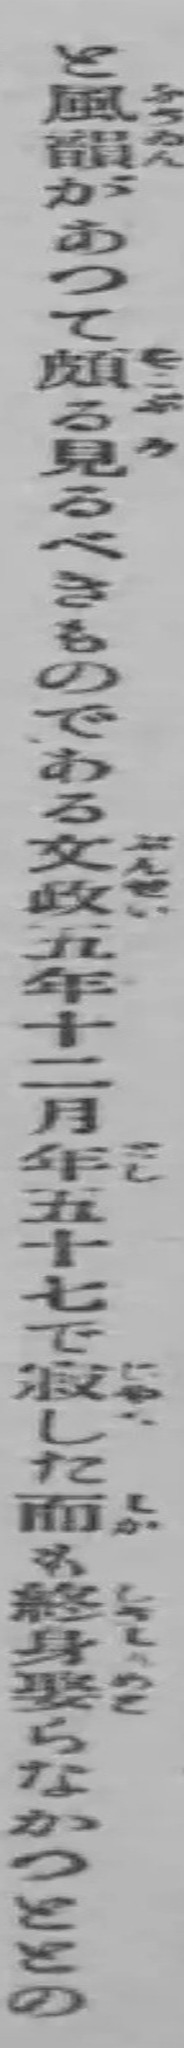と風韻があつて頗る見るべきものである文政五年十二月年五十七で寂した而も終身娶らなかつたととの
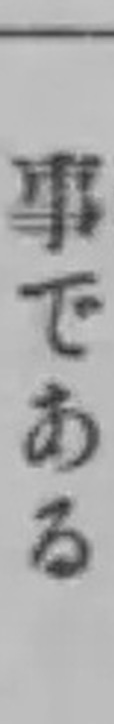事である
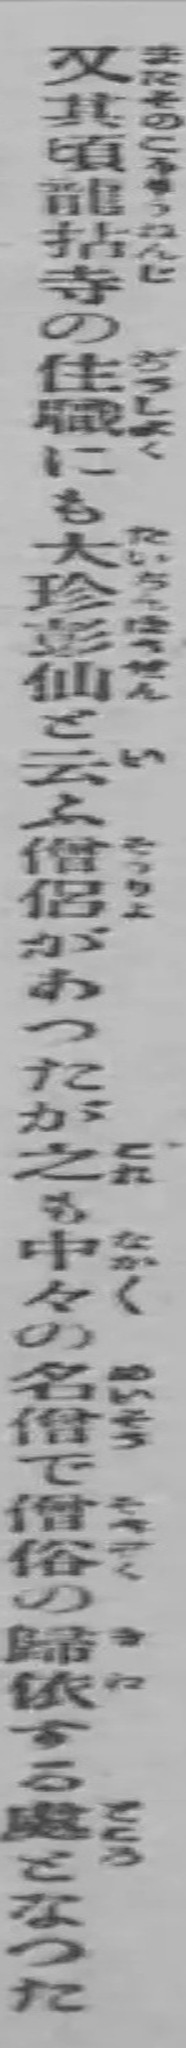大珍彭仙又其頃龍拈寺の住職にも大珍彭仙と云ふ僧侶があつたが之も中々の名僧で僧俗の帰依する処となつた
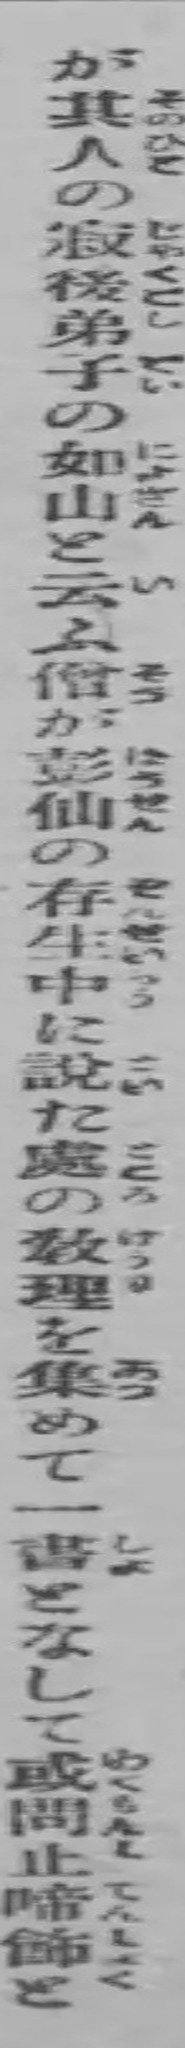が其人の寂後弟子の如山と云ふ僧が彭仙の存生中に説いた処の教理を集めて一書となして或問止啼飾と
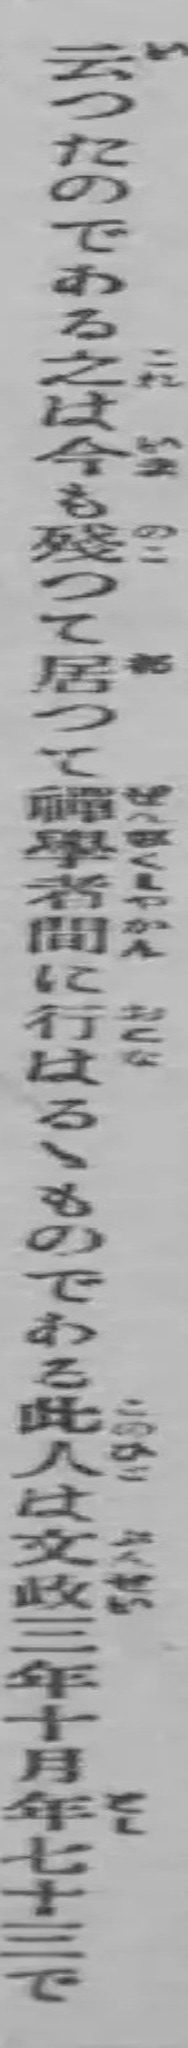云つたのである之は今も残つて居つて禅学者間に行はるゝものである此人は文政三年十月年七十三で
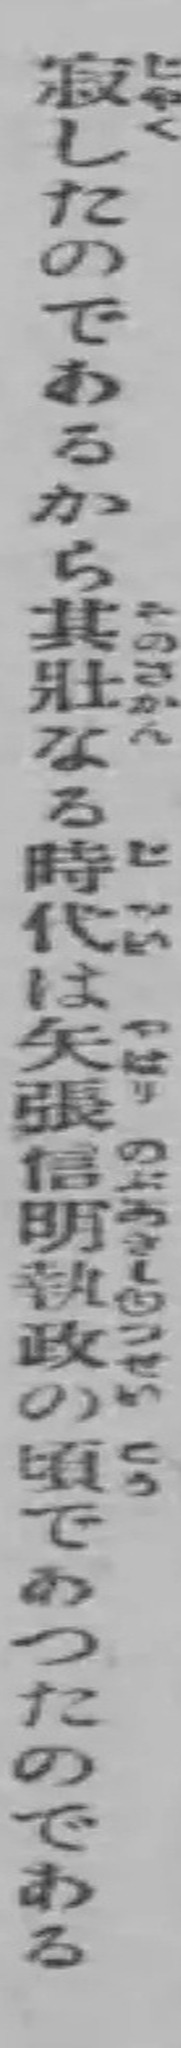寂したのであるから其壮なる時代は矢張信明執政の頃であつたのである
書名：豊橋市史談
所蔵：国立国会図書館 National Diet Library, JAPAN
